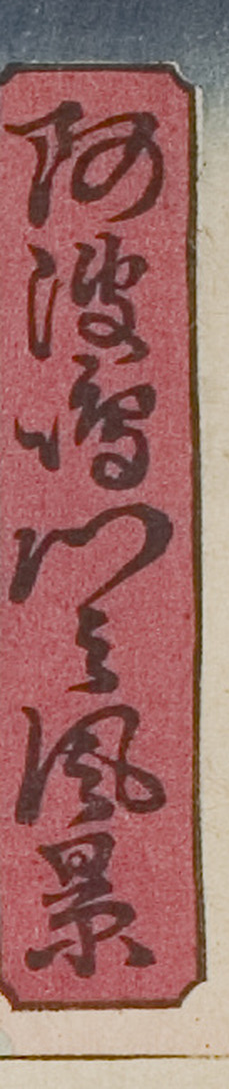阿波鳴門之風景
